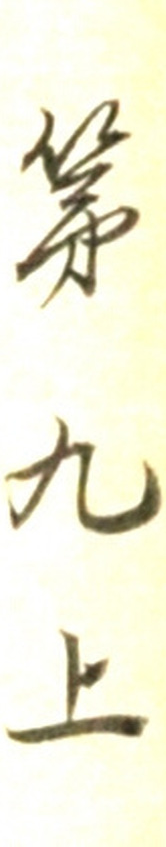第九上
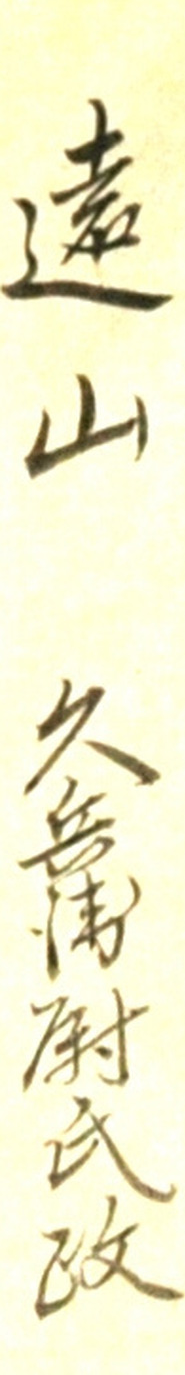遠山久兵衛尉氏政

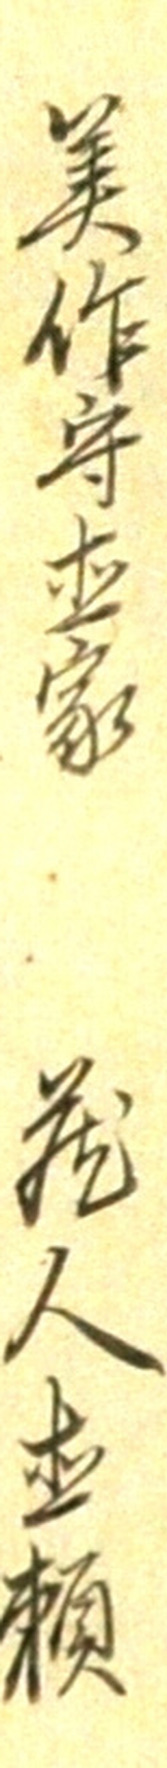美作守直家蔵人直頼
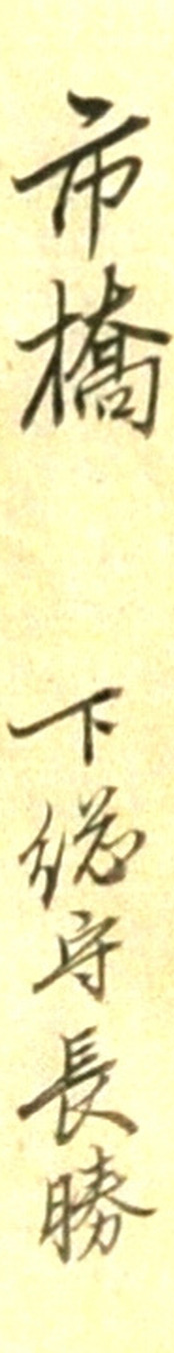市橋下総守長勝
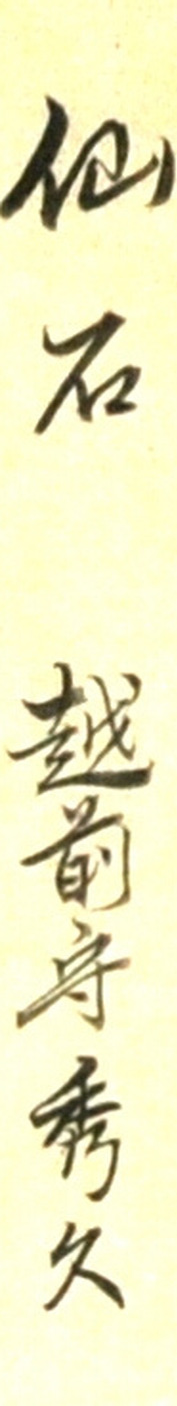仙石越前守秀久
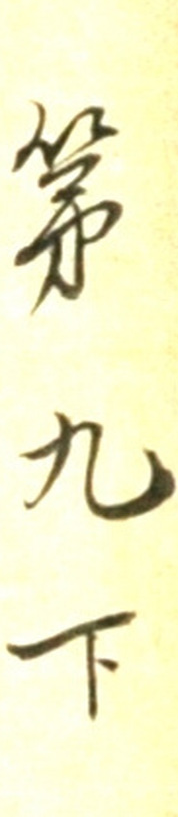第九下
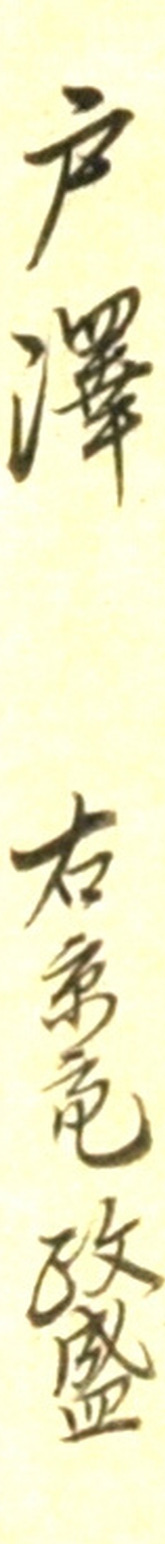戸沢右京亮政盛
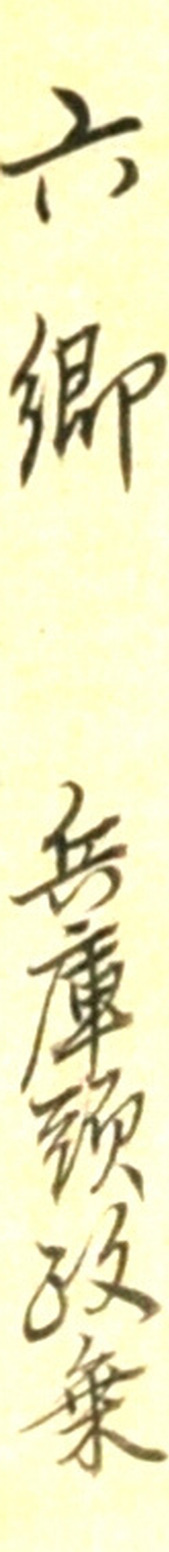六郷兵庫頭政乗
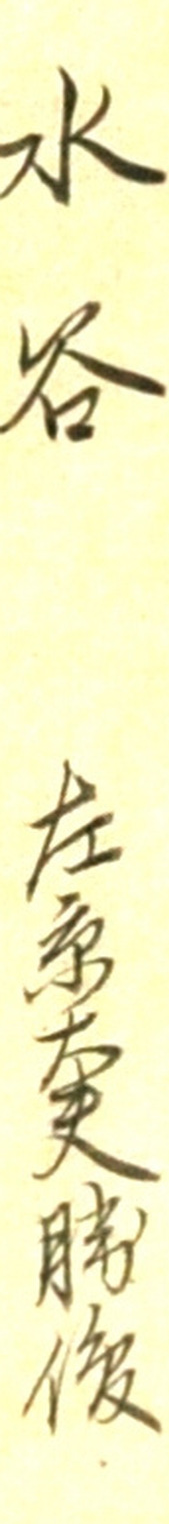水谷左京大夫勝俊

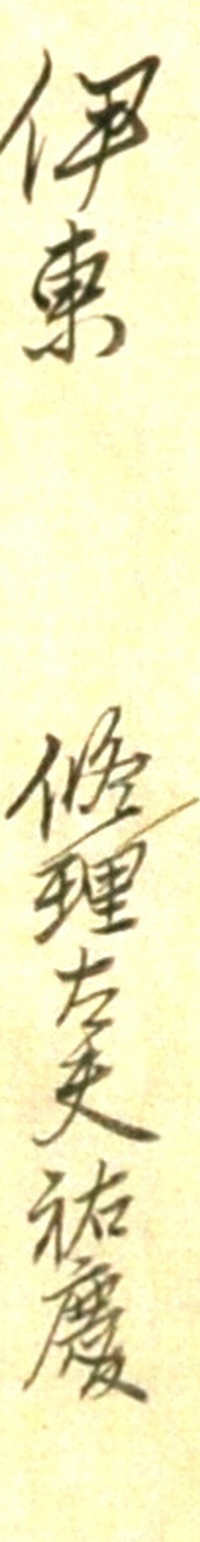伊東修理太夫祐慶
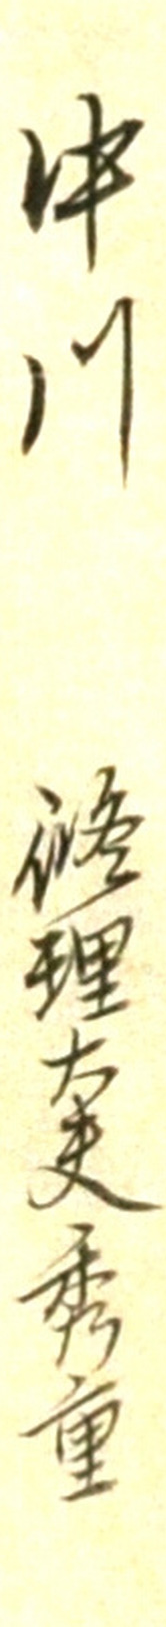中川修理大夫秀重
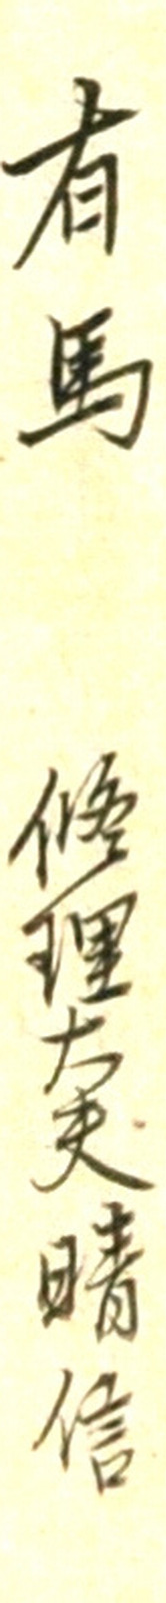有馬修理大夫晴重
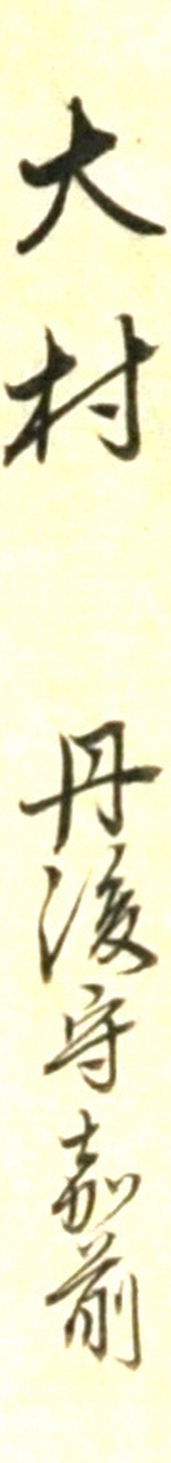大村丹後守嘉前
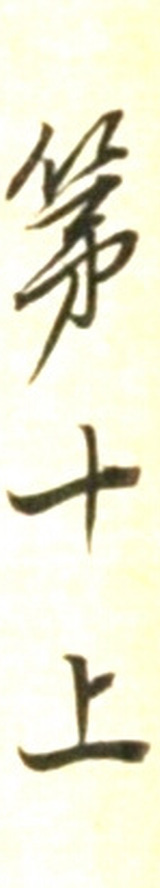第十上
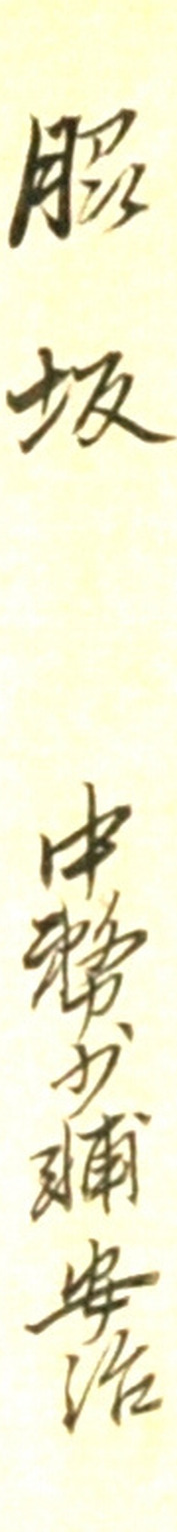脇坂中務少輔安治
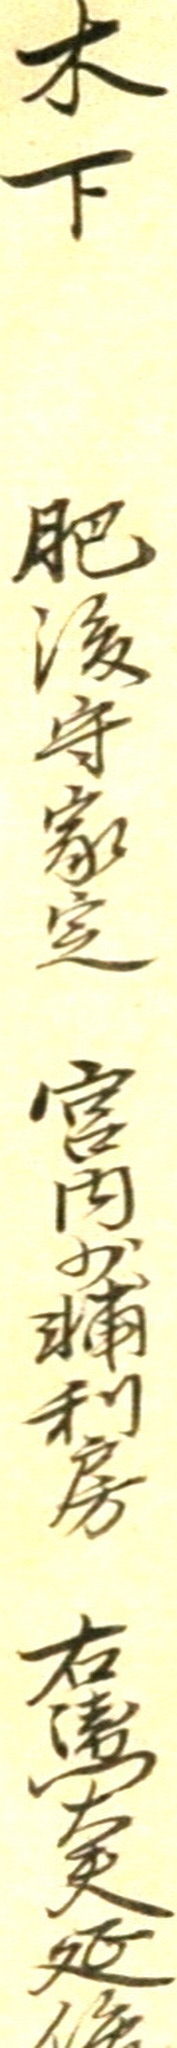木下肥後守家定宮内少輔利房右衛門大夫延俊
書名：藩翰譜（一）
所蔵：伊那市立高遠町図書館・合同会社AMANE
